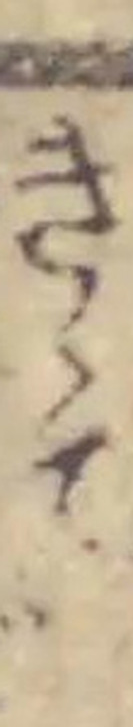きゝて
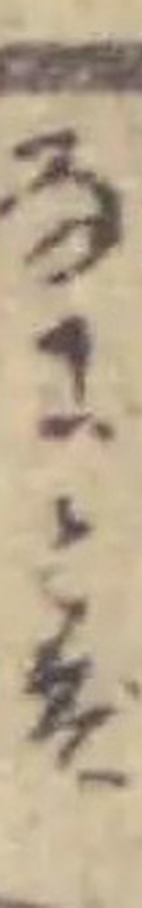なにとぞ
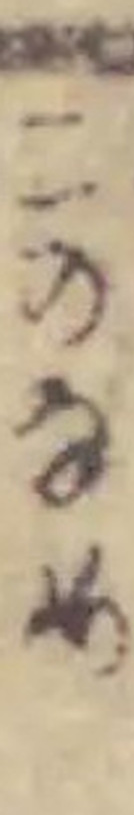このなめ
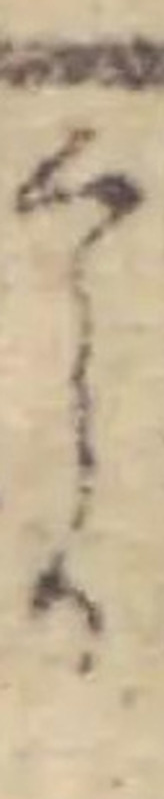くしり
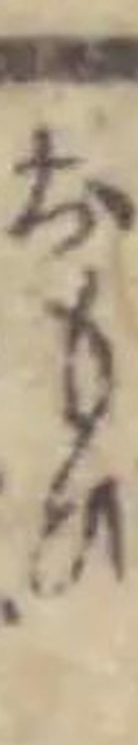おもひ
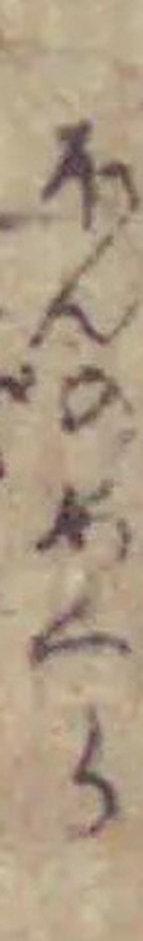〽ほんのめくら
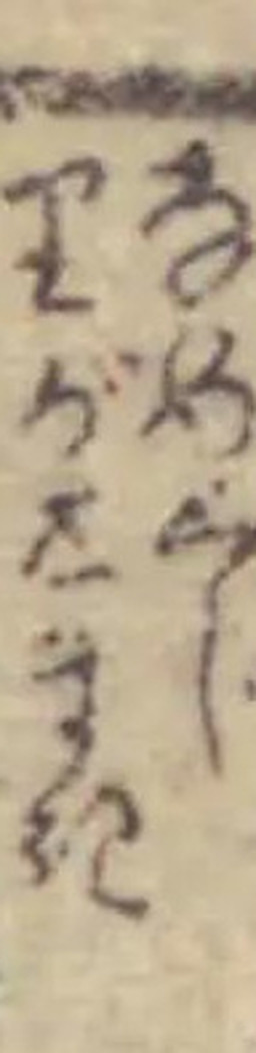りがこまき
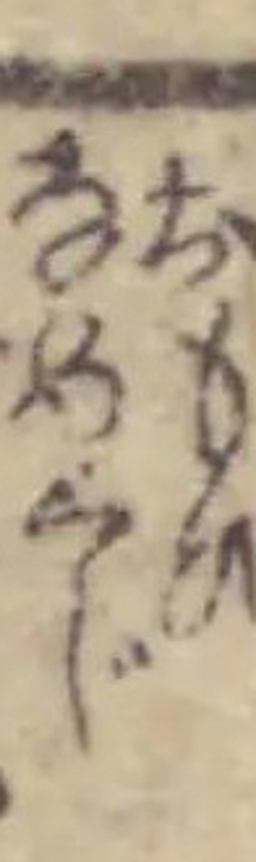なめくじ
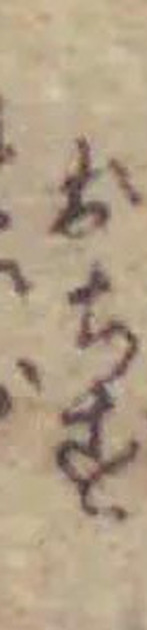おちず
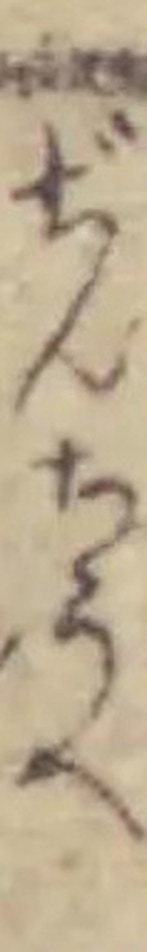ぢんちうへ
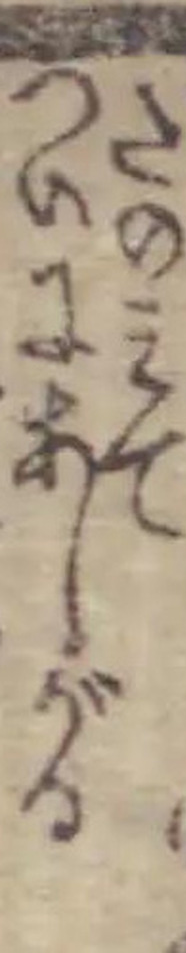ついにあしがる
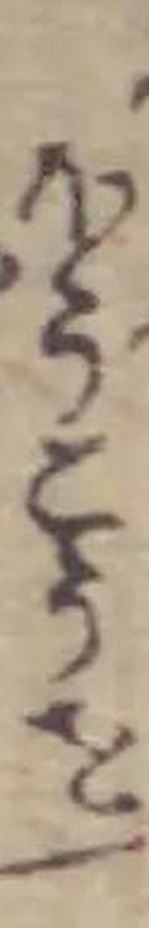ほうこうを
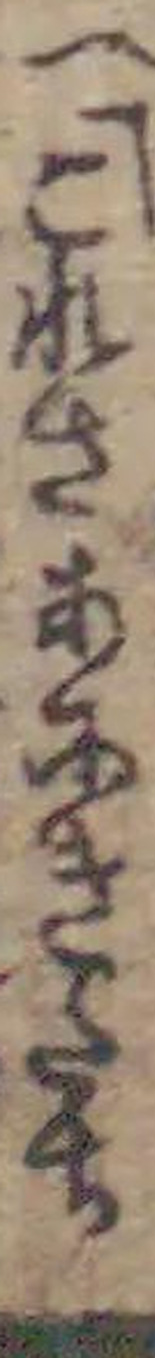〽これさあにきたち
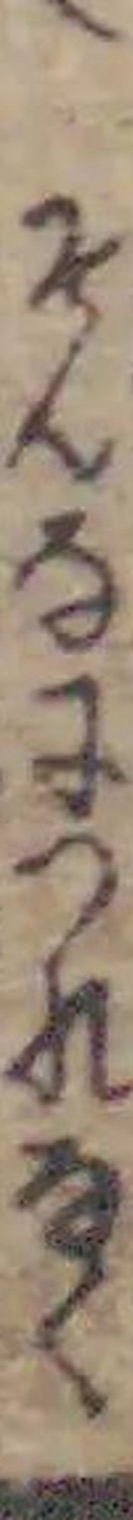そんなにつれなく
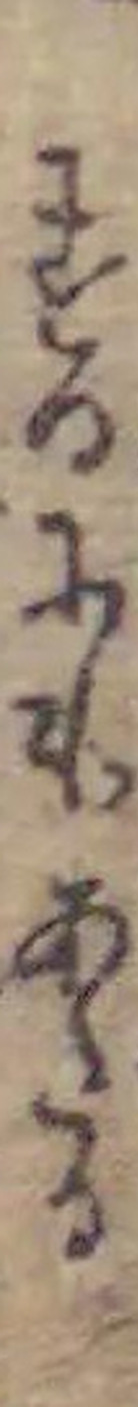するにもあたる
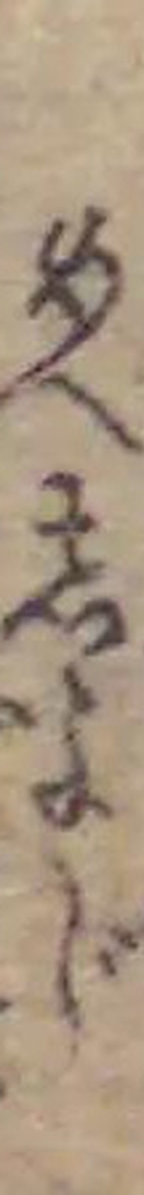めへしよじ
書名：化物太平記 3巻
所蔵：国立国会図書館 National Diet Library, JAPAN
